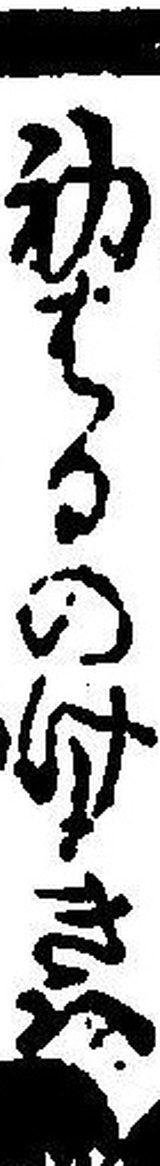初はるのけしきは
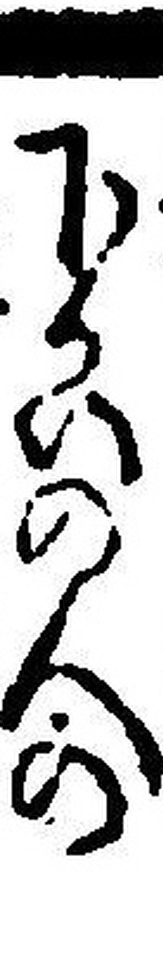下かいの人の
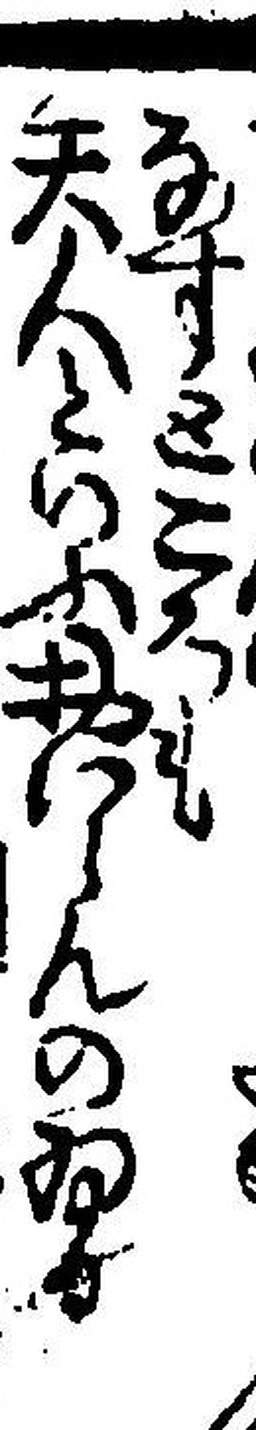天人といふおいらんのゐる
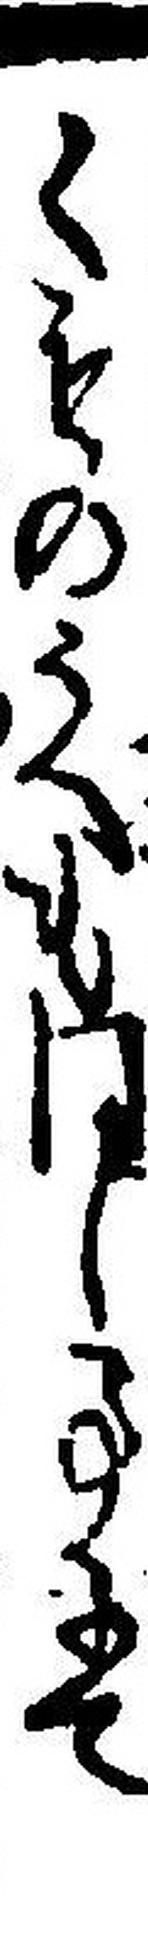くものうへも同し事にて
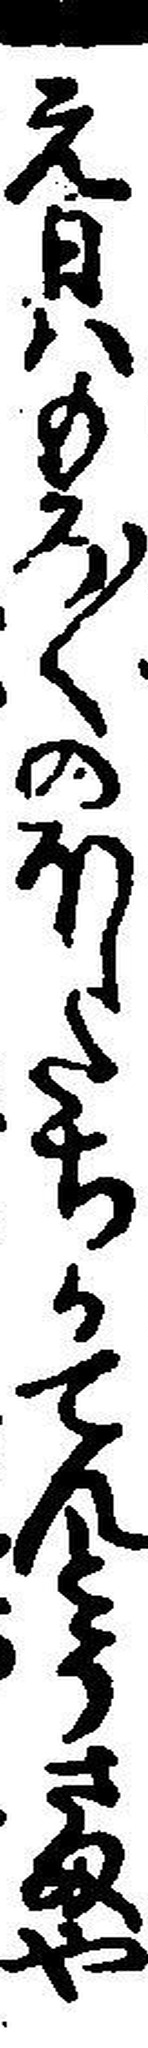元日はもろ〳〵のほしたちかてんとうさまや
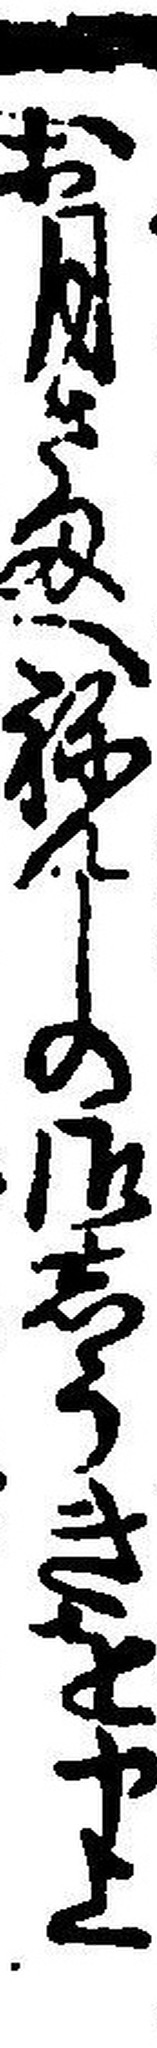お月さまへねんしの御しうきを申上
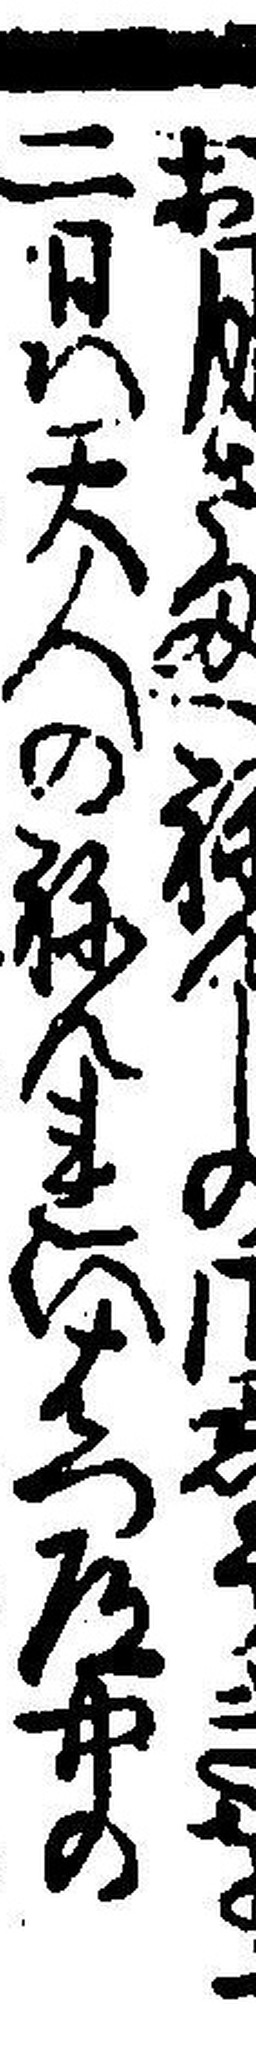二日は天人のねんれいはつ道中の
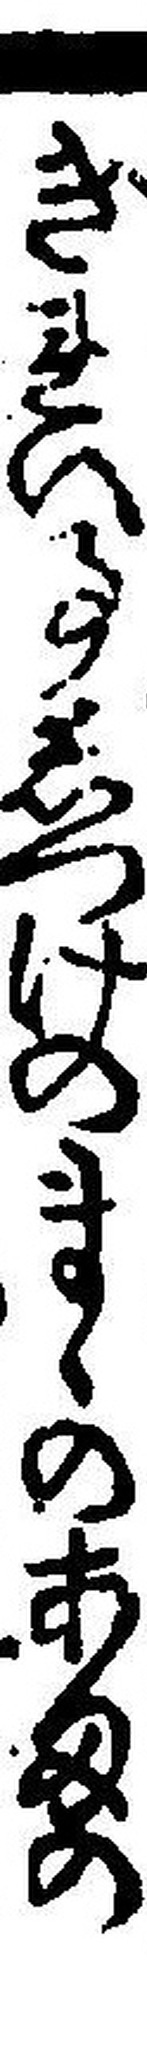きれい事しつけのまゝのあまの
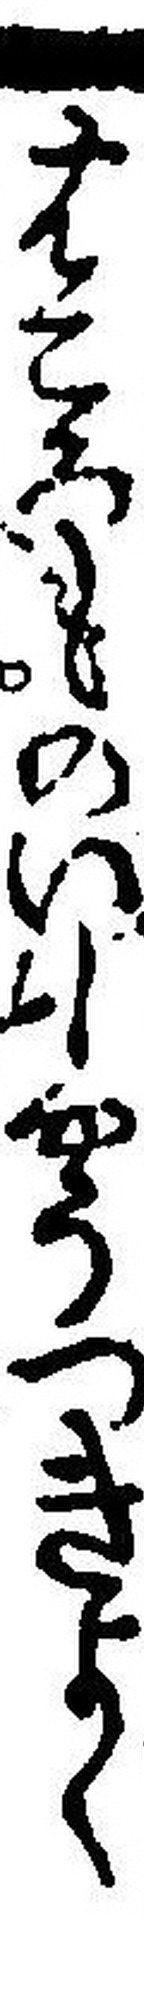はころものいしやうつきよく
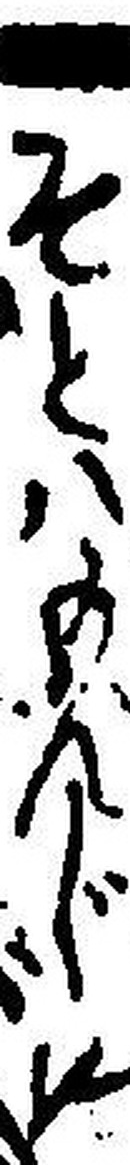そとはもんじ
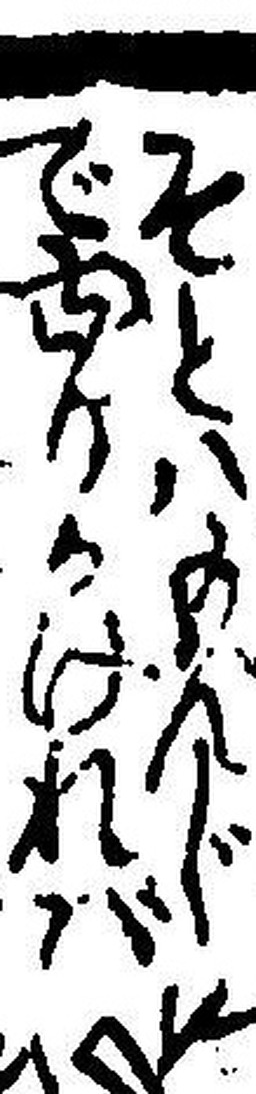でゆりかければ
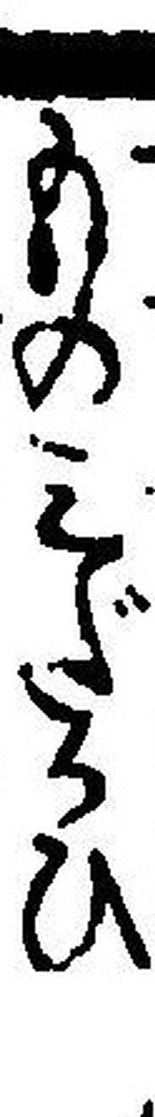ものみだかひ
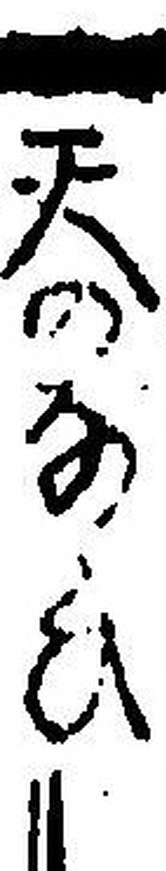天のならひ
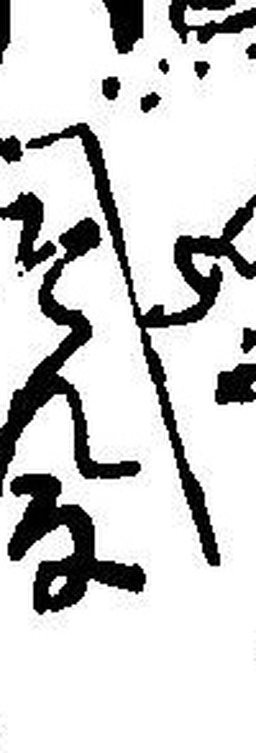〽そんな
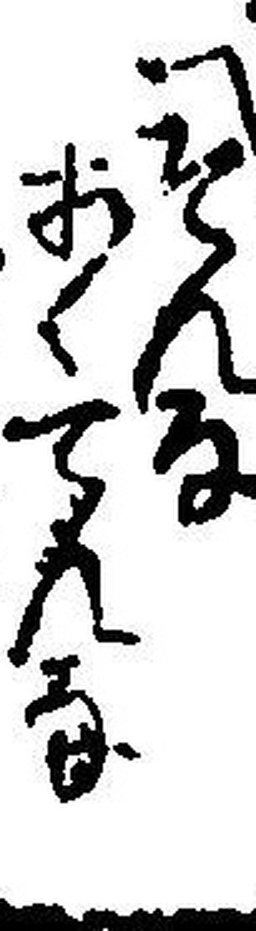おくてんな
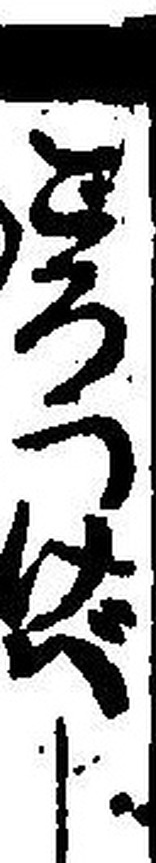ごろつけば
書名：徳若水縁起金性 / 樹下石上作
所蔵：東京大学総合図書館 General Library in the University of Tokyo, JAPAN
